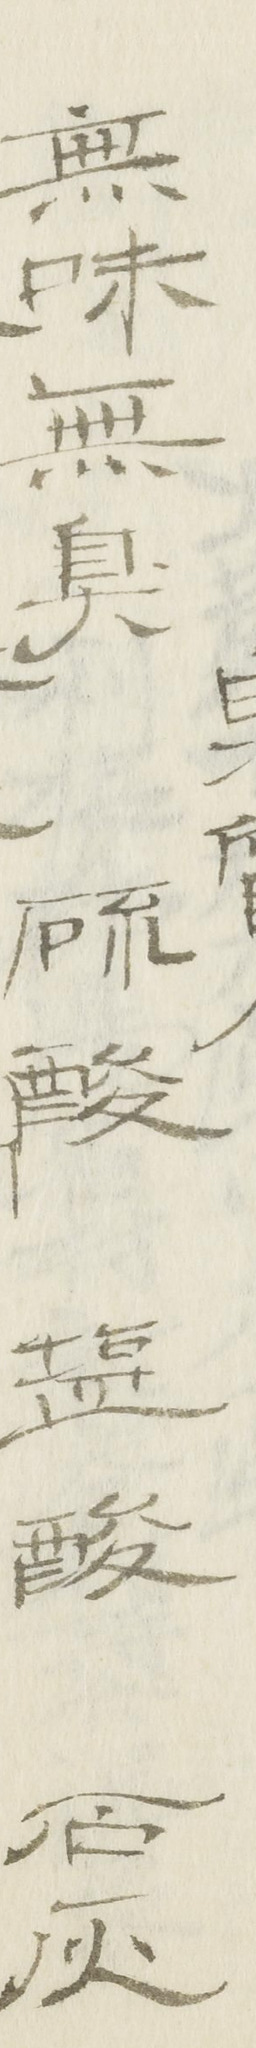無味無臭硫酸塩酸石灰
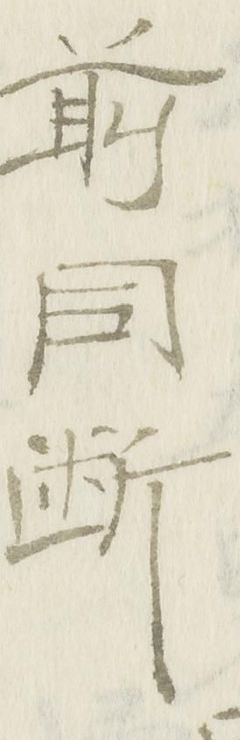前同断

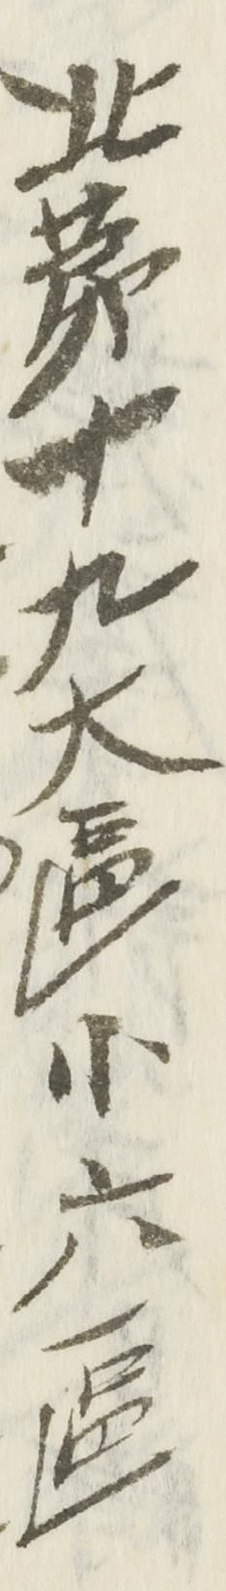北第十九大区小六区
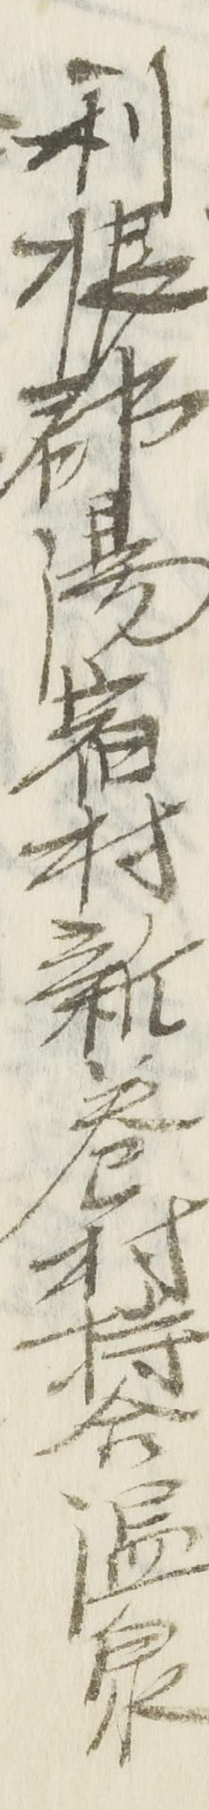利根郡湯宿村新巻村持合温泉
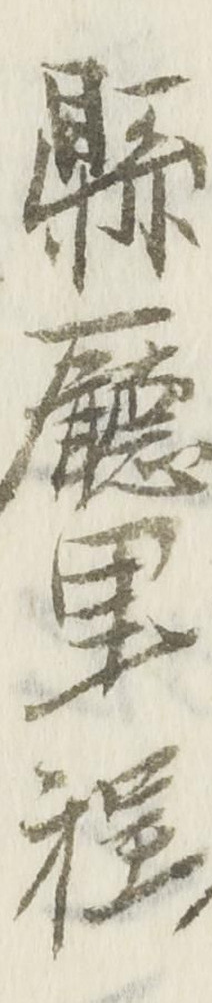県庁里程
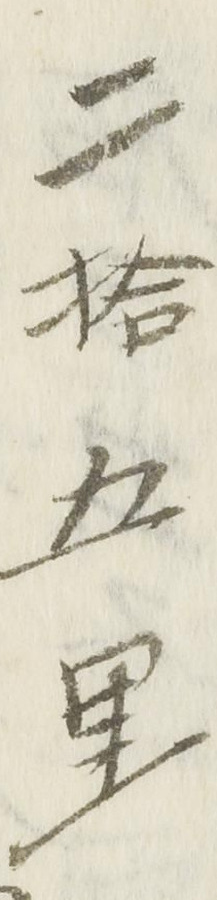二拾五里
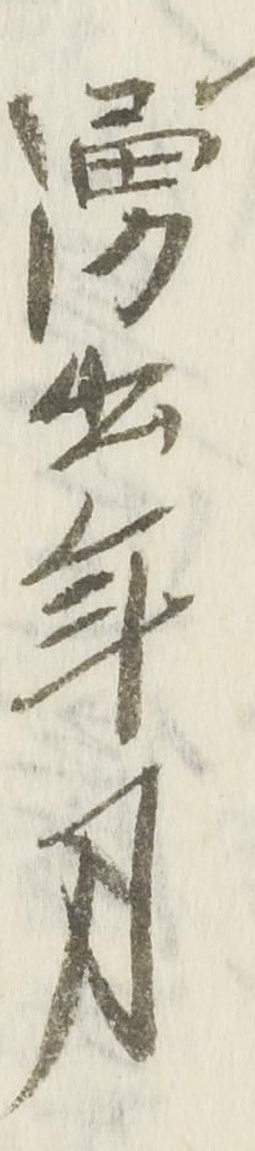湧出年月
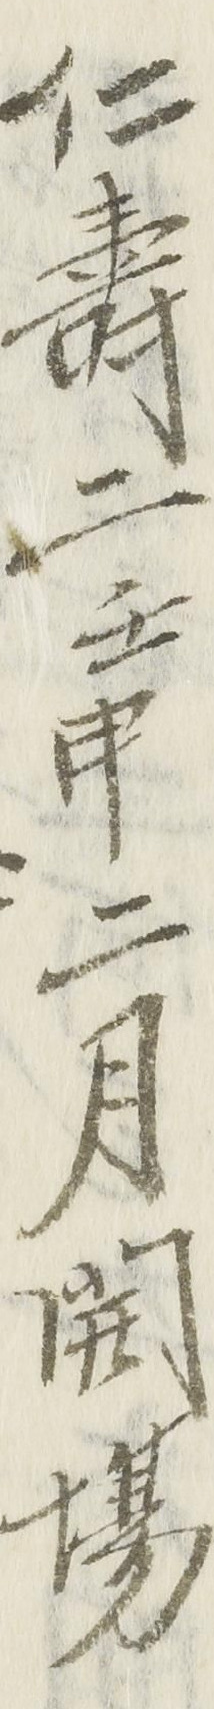仁壽二壬申二月開場
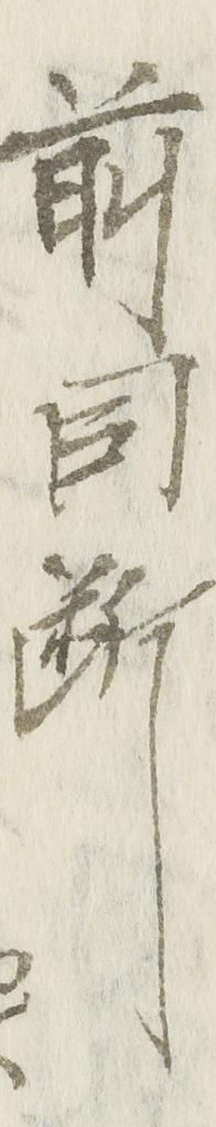前同断
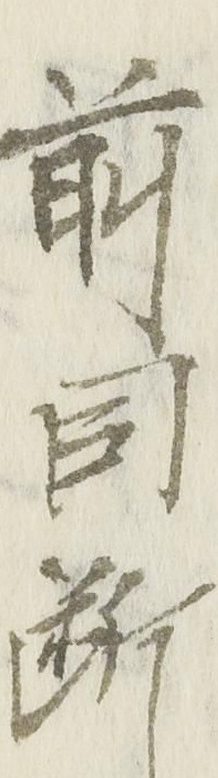前同断
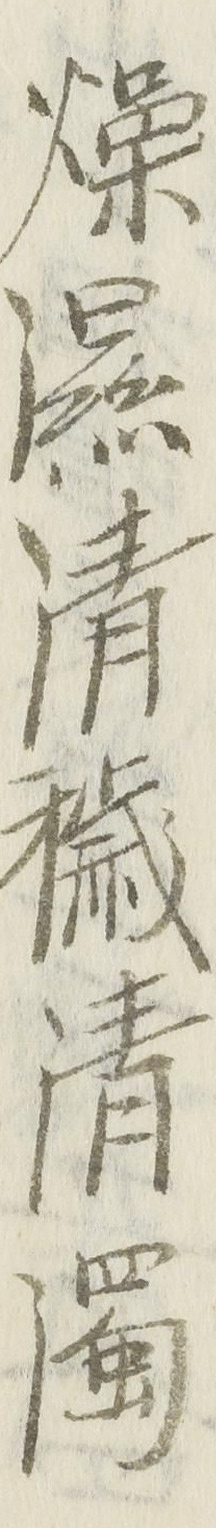燥湿清穢清濁
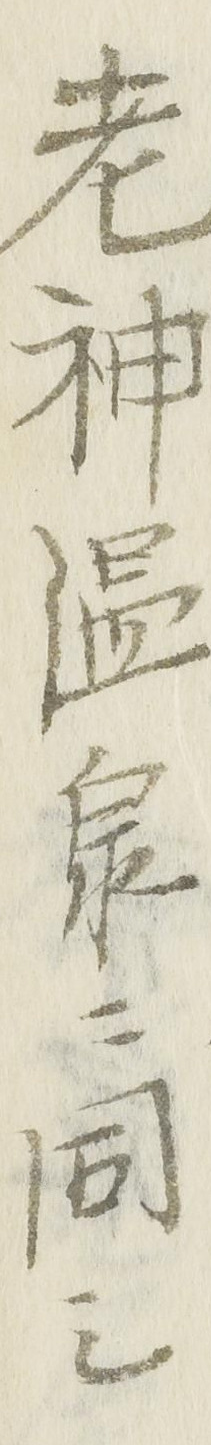老神温泉ニ同シ

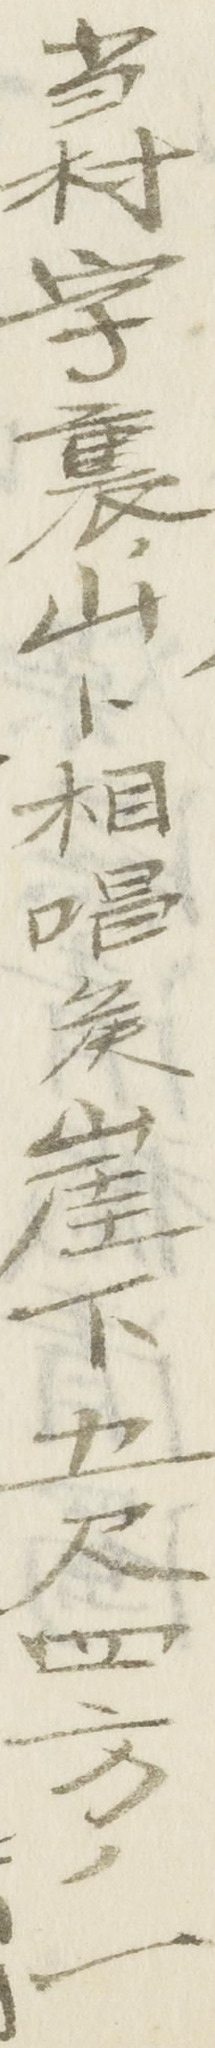当村字裏山ト相唱候崖下五尺四方ノ一
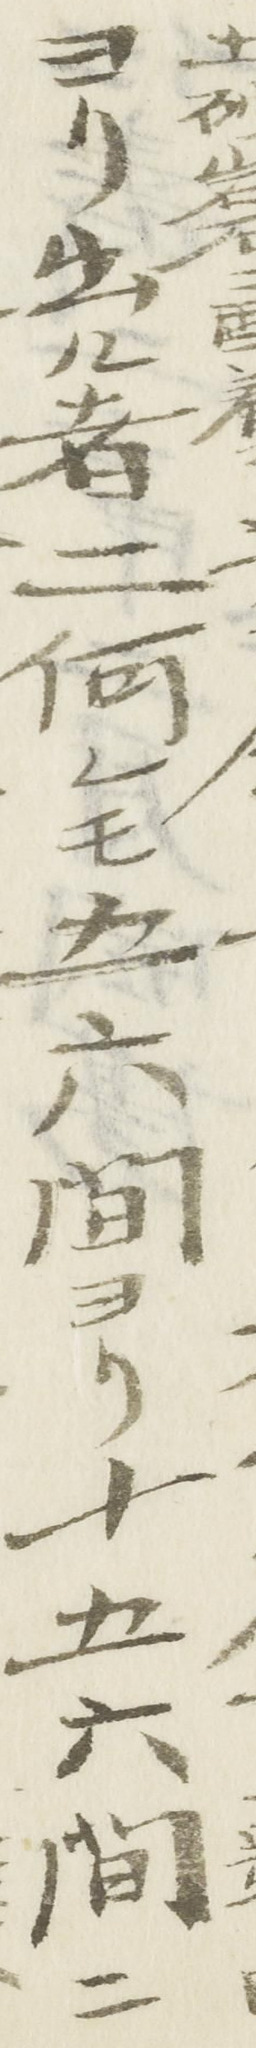ヨリ出ル者ニ何レモ五六間ヨリ十五六間ニ
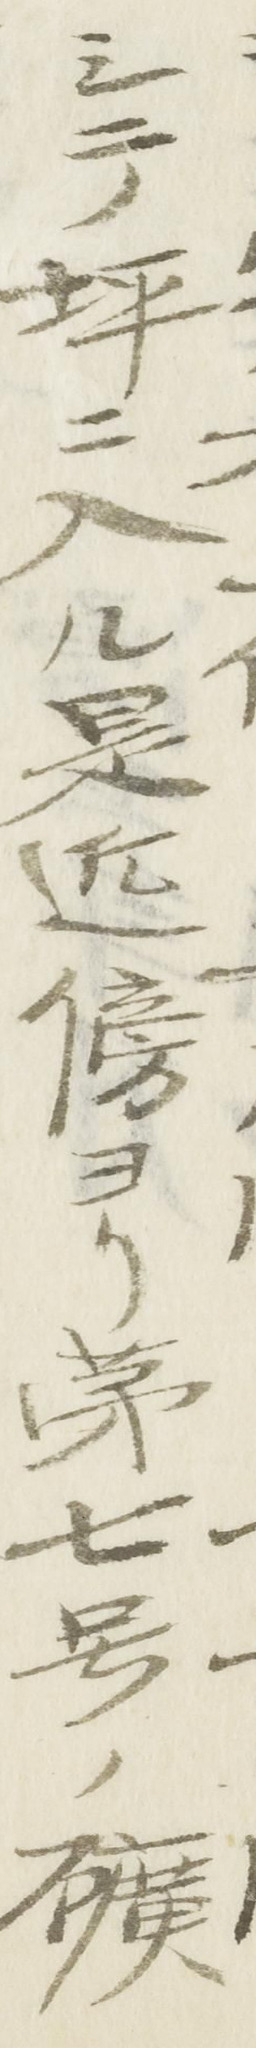シテ坪ニ入ル是近傍ヨリ第七号ノ鉱
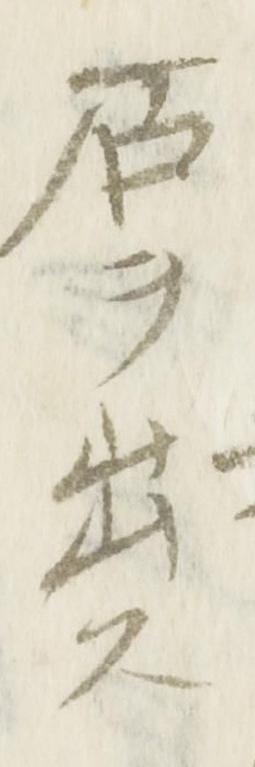石ヲ出ス
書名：温冷泉試験表
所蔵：東京大学地震研究所図書室 Earthquake Research Institute Library, The University of Tokyo, JAPAN
